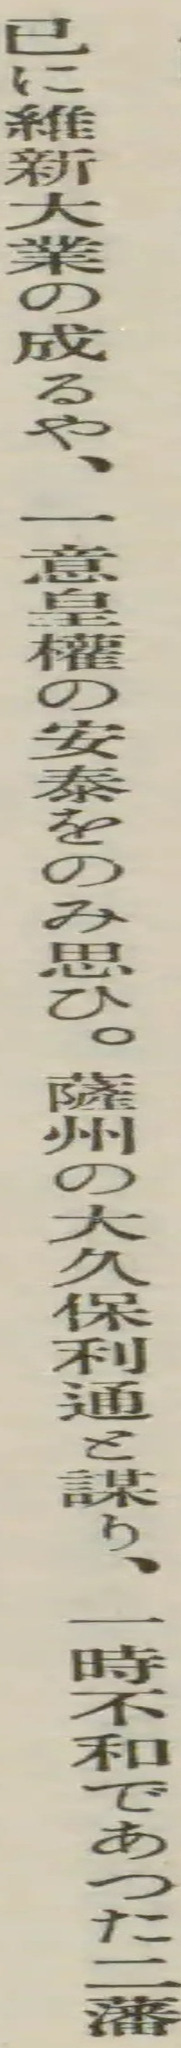已に維新大業の成るや、一意皇権の安泰をのみ思ひ。薩州の大久保利通と謀り、一時不和であつた二藩
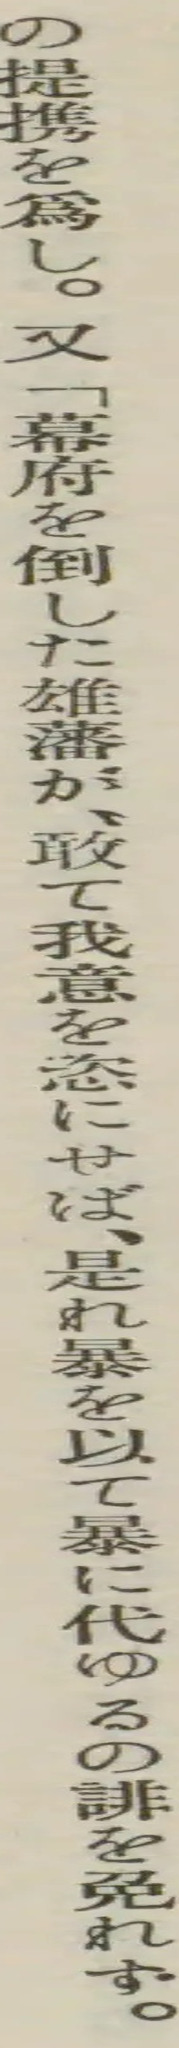の提携を為し。又「幕府を倒した雄藩が、敢て我意を恣にせば、是れ暴を以て暴に代ゆるの誹を免れず。
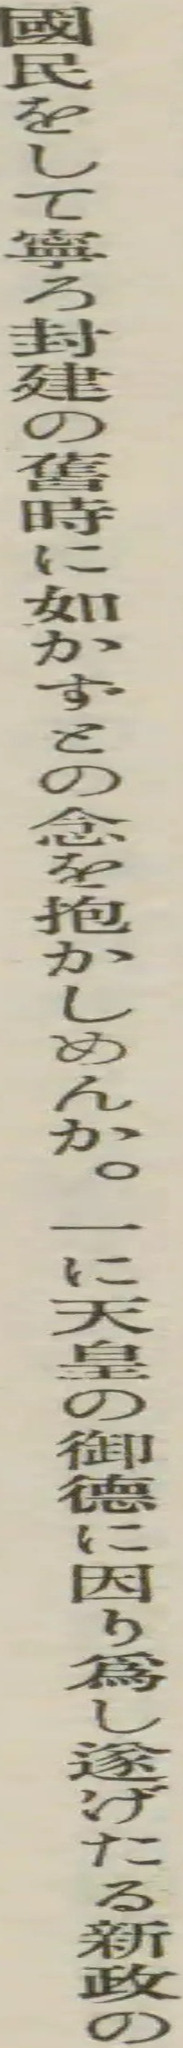国民をして寧ろ封建の旧時に如かずとの念を抱かしめんか。一に天皇の御徳に因り成し遂げたる新政の
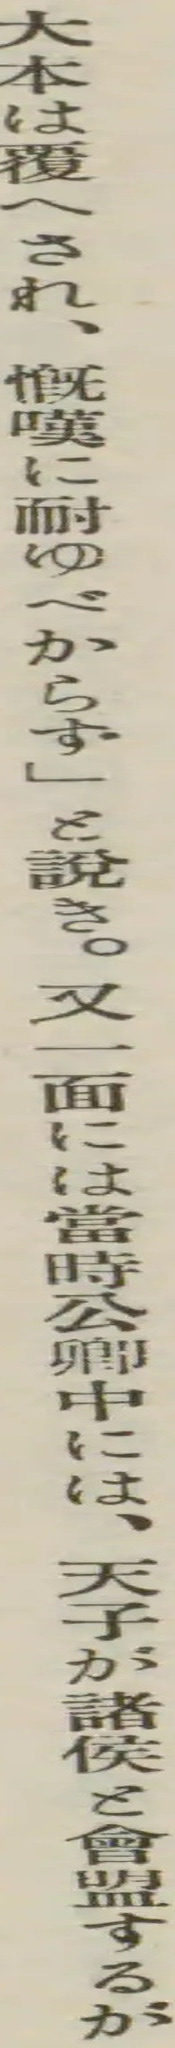大本は覆へされ、慨嘆に耐ゆべからず」と説き。又一面には当時公卿中には、天子が諸侯と会盟するが
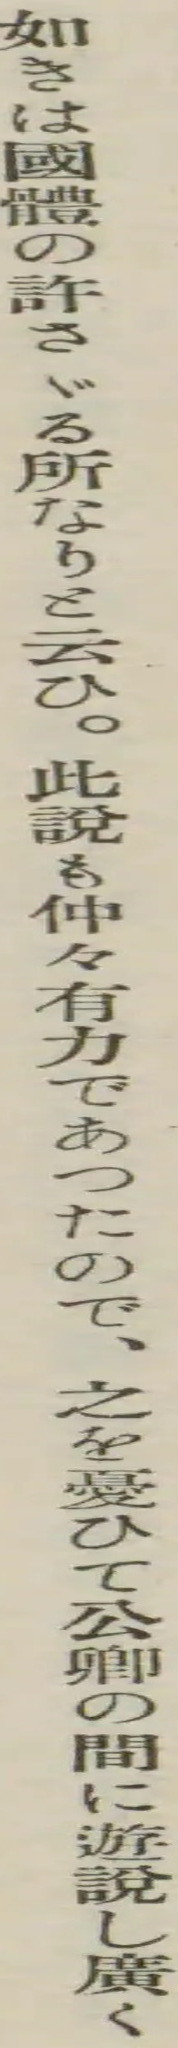如きは国体の許さゞる所なりと云ひ。此説も仲々有力であつたので、之を憂ひて公卿の間に遊説し広く
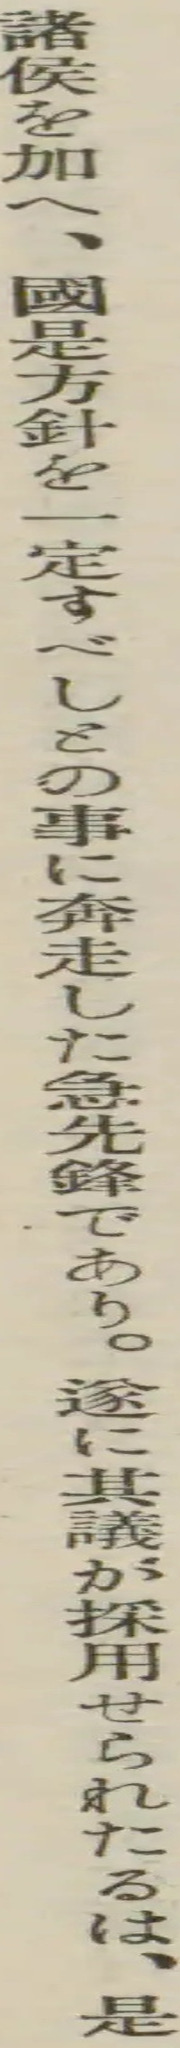諸侯を加へ、国是方針を一定すべしとの事に奔走した急先鋒であり。遂に其議が採用せられたるは、是

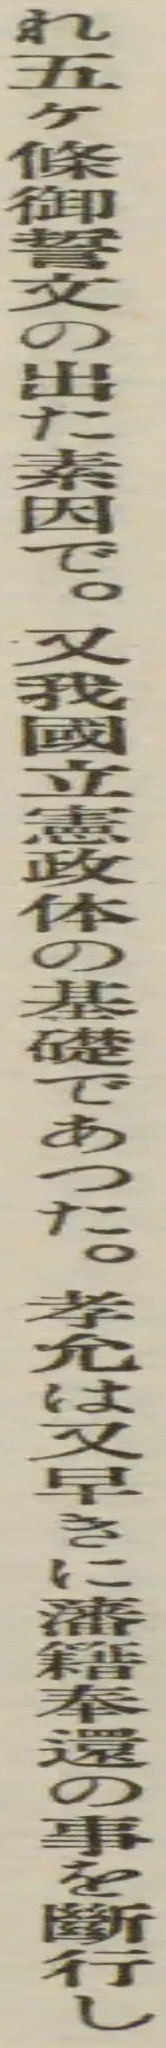れ五ヶ条御誓文の出た素因で。又我国立憲政体の基礎であつた。孝允は又早きに藩籍奉還の事を断行し
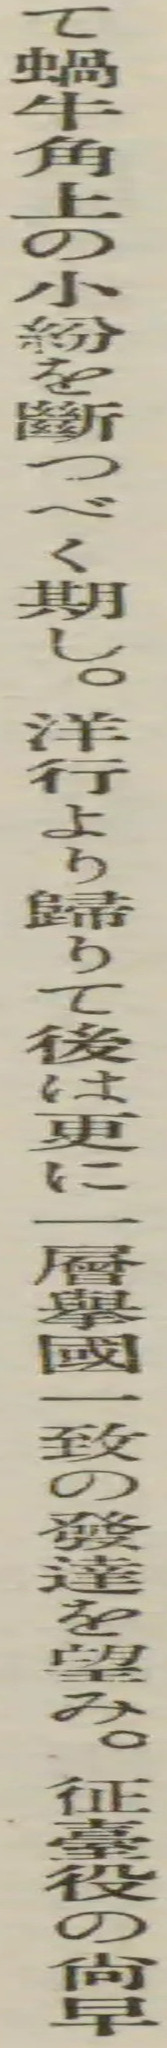て蝸牛角上の小紛を絶つべく期し。洋行より帰りて後は更に一層挙国一致の発達を望み。征台役の尚早
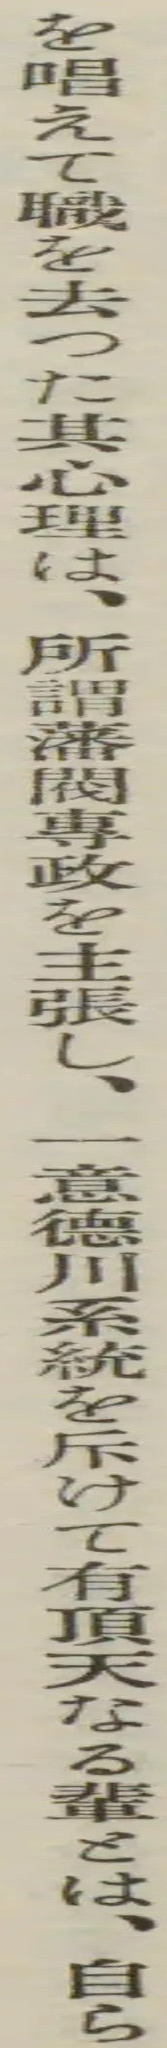を唱えて職を去つた其心理は、所謂藩閥専政を主張し、一意徳川系統を斥けて有頂天なる輩とは、自ら
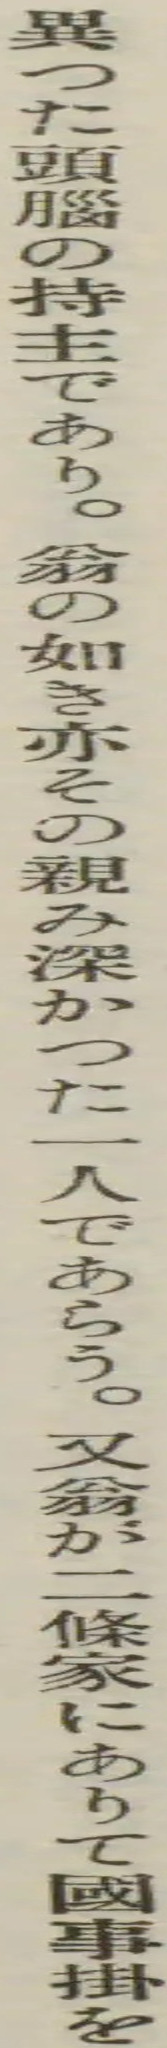異つた頭脳の持主であり。翁の如き亦その親み深かつた一人であらう。又翁が二條家にありて国事掛を
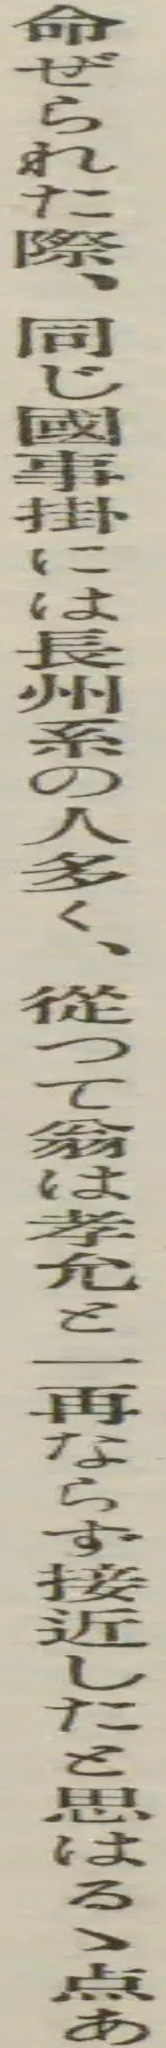命ぜられた際、同じ国事掛には長州系の人多く、従つて翁は孝允と一再ならず接近したと思はるゝ点あ
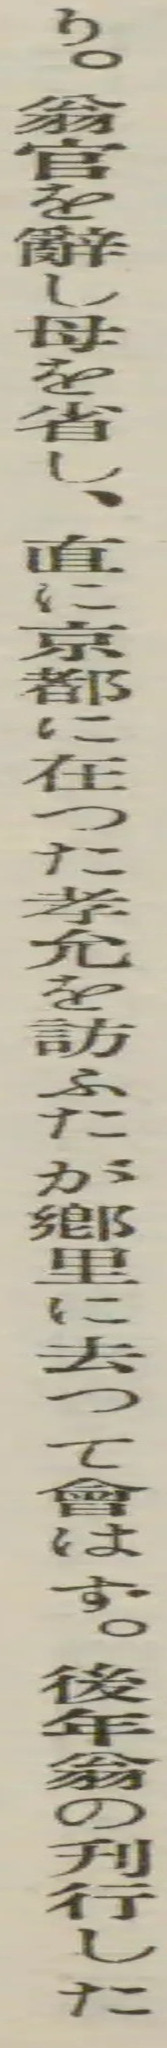り。翁官を辞し母を省し、直に京都に在つた孝允を訪ふたが郷里に去つて会はず。後年翁の刊行した
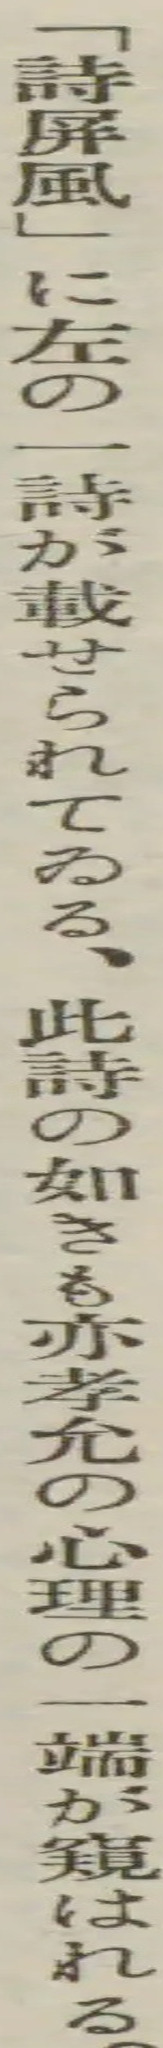「詩屏風」に左の一詩が載せられてゐる、此詩の如きも亦孝允の心理の一端が窺はれる。
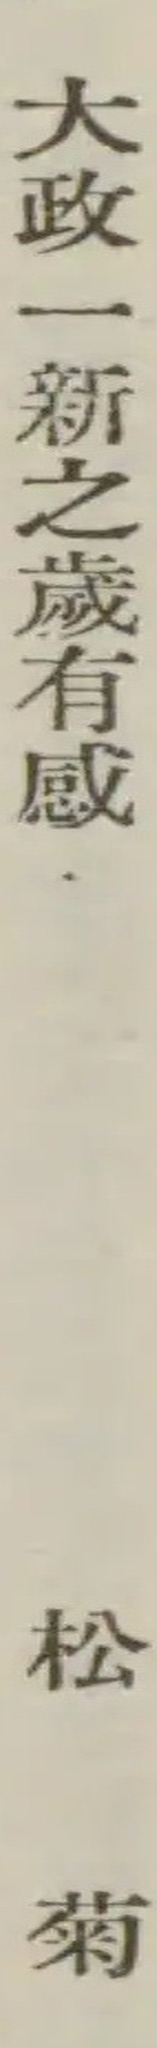大政一新之歳有感松菊
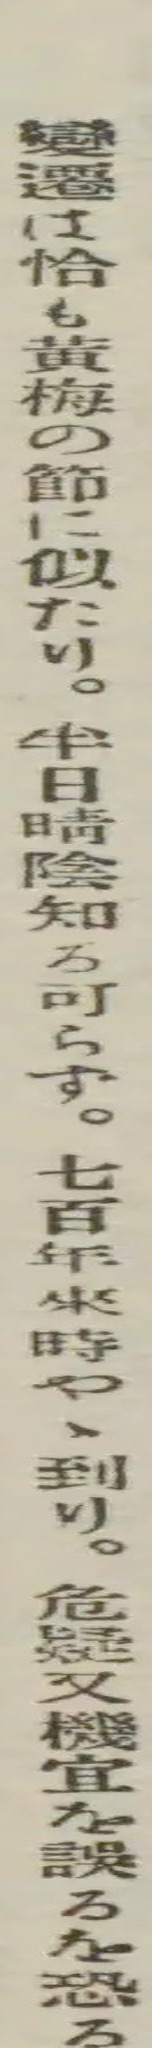変遷は恰も黄梅の節に似たり。半日晴陰知る可らず。七百年来時やゝ到り。危疑又機宜を誤るを恐る。
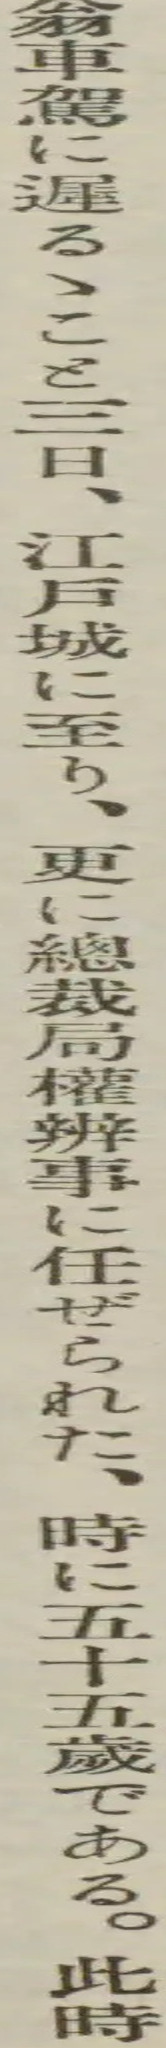翁車駕に遅るゝこと三日、江戸城に至り、更に総裁局権辨事に任ぜられた、時に五十五歳である。此時
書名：小野湖山翁小伝
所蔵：国立国会図書館 National Diet Library, JAPAN
